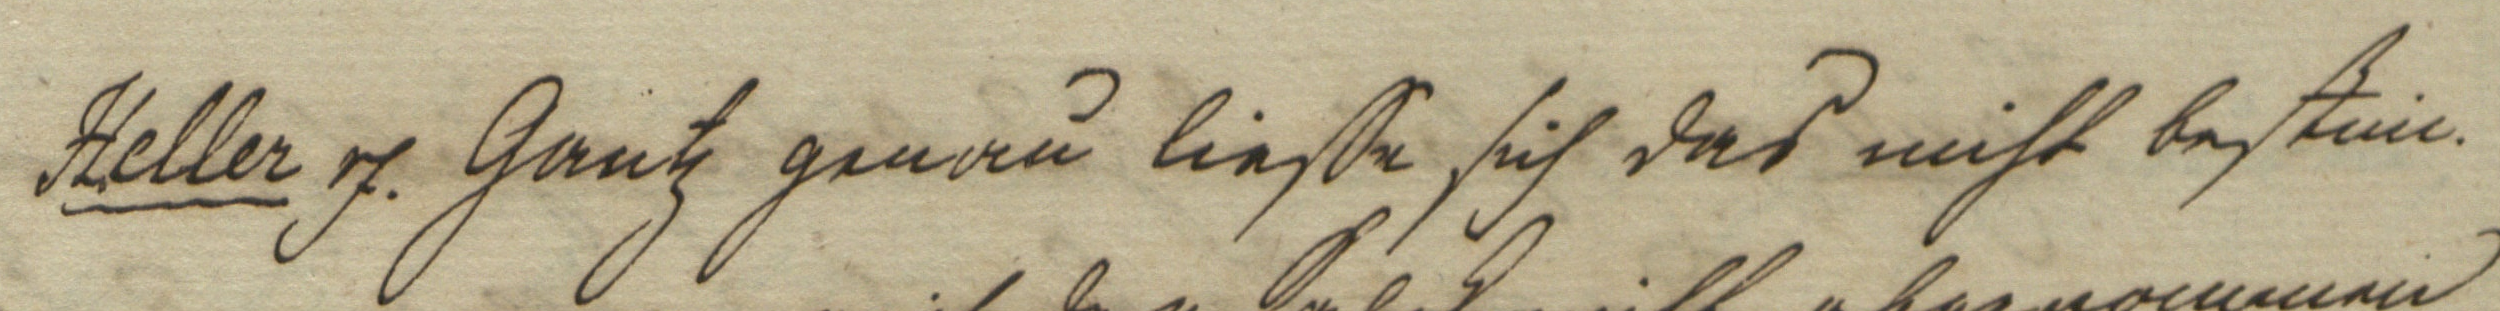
Heller rf. Gantz genau liesse sich das nicht bestim¬
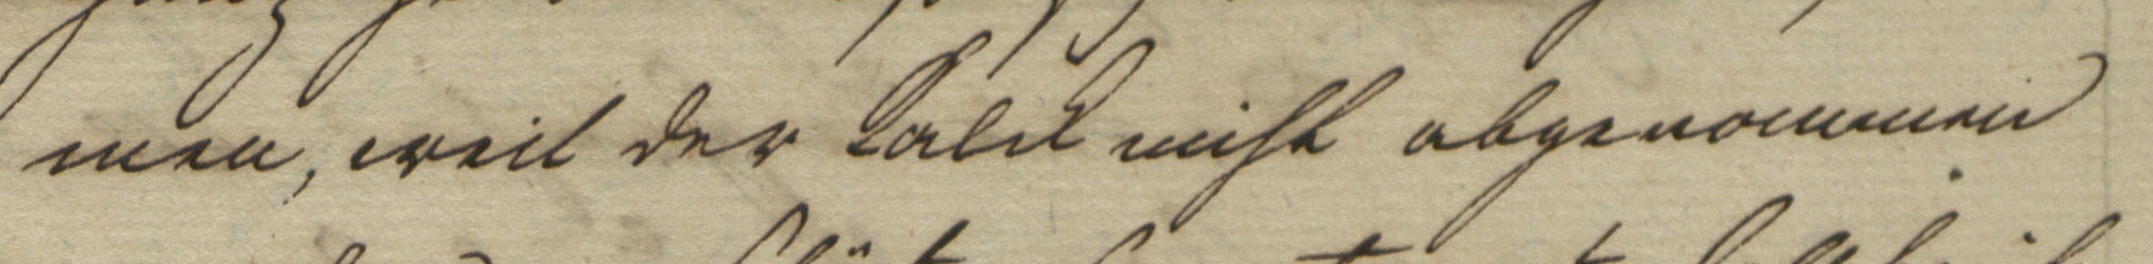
men, weil der Kalck nicht abgenommen
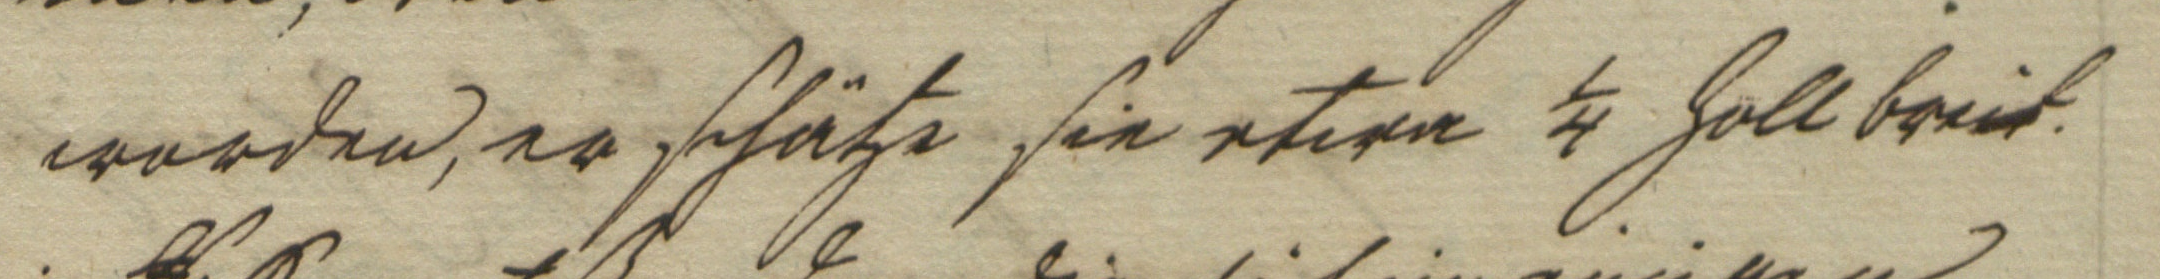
worden, er schätze sie etwa ¼ Zoll breit.
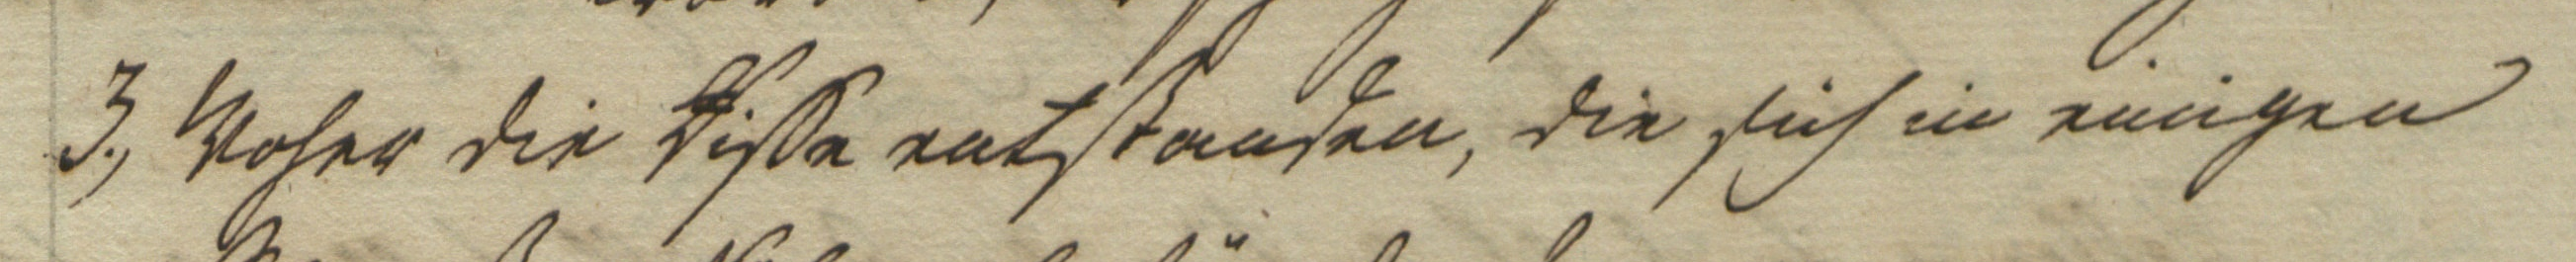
3. Woher die Risse entstanden, die sich in einigen
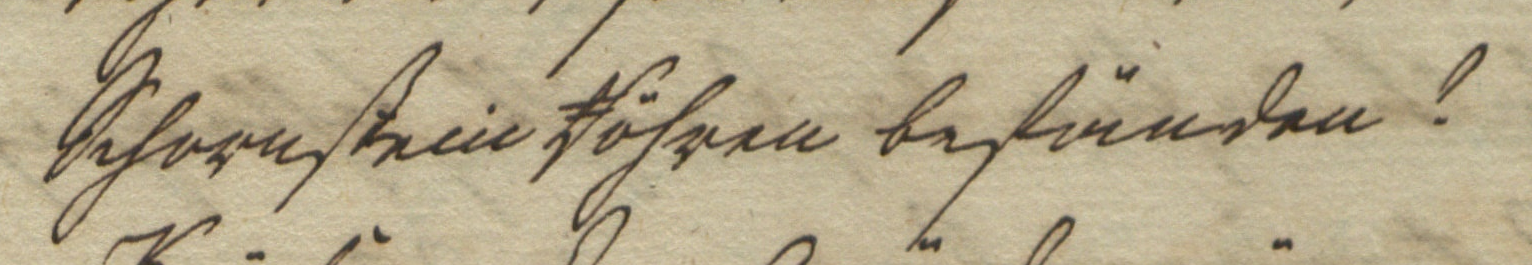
SchorneinRöhren befänden?
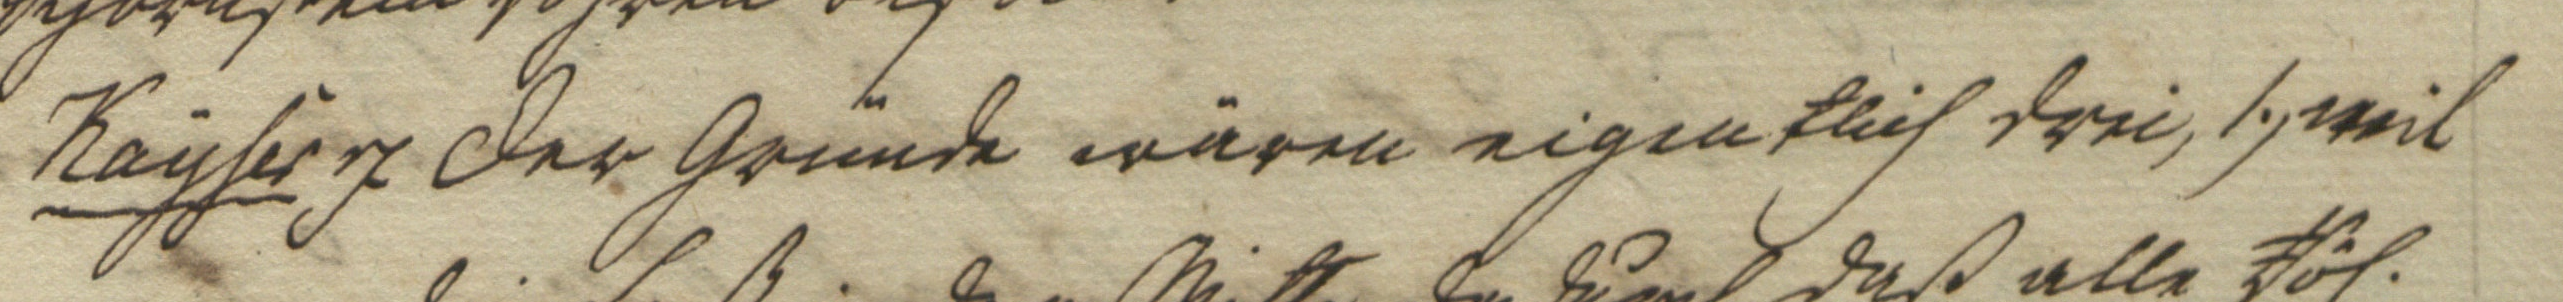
Kaÿser rf. Der Gründe wären eigentlich drei, 1. weil
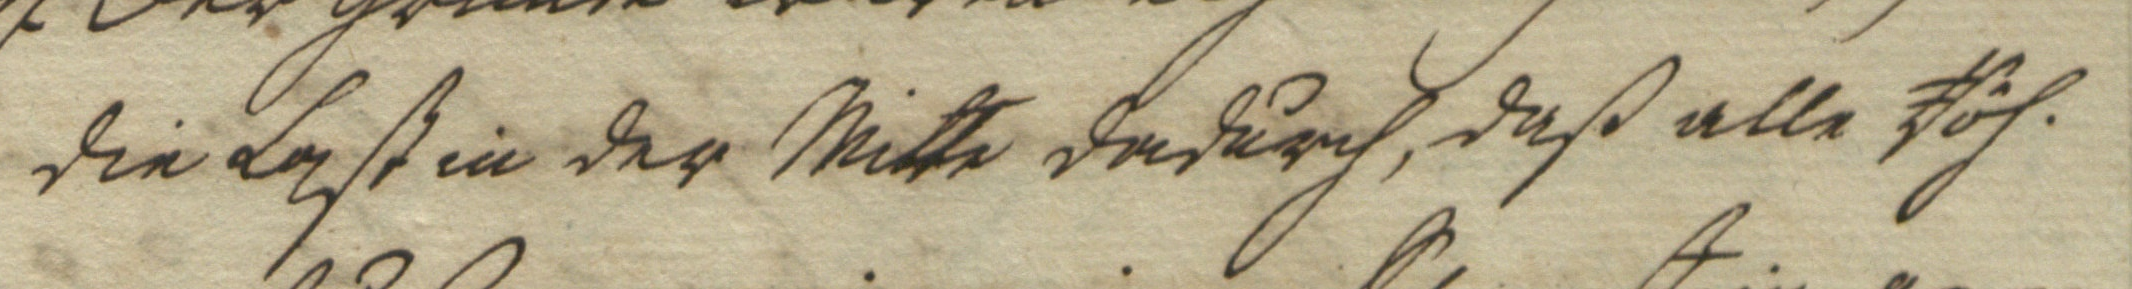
die Last in der Mitte dadurch, daß alle Röh¬
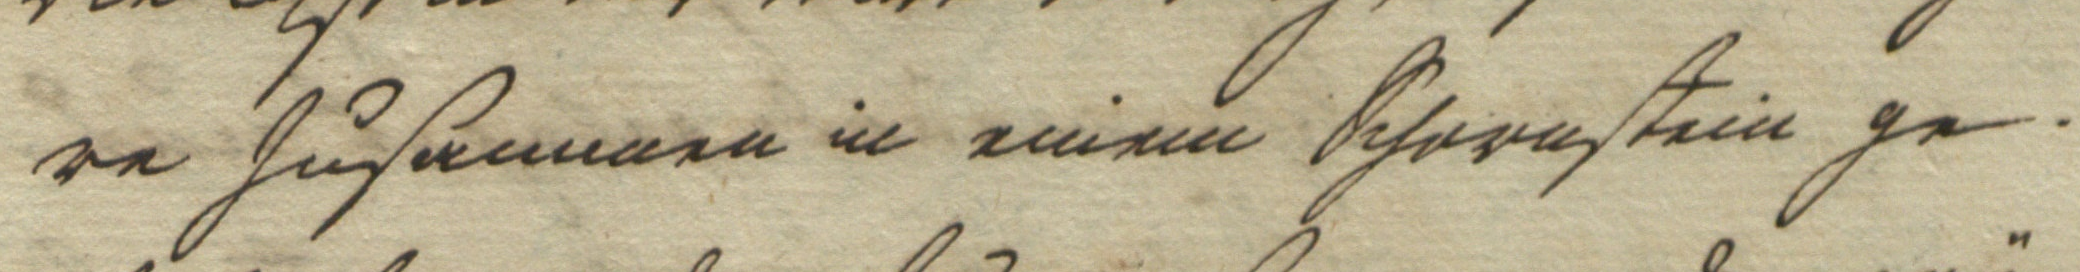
re zusammen in einem Schornstein ge¬
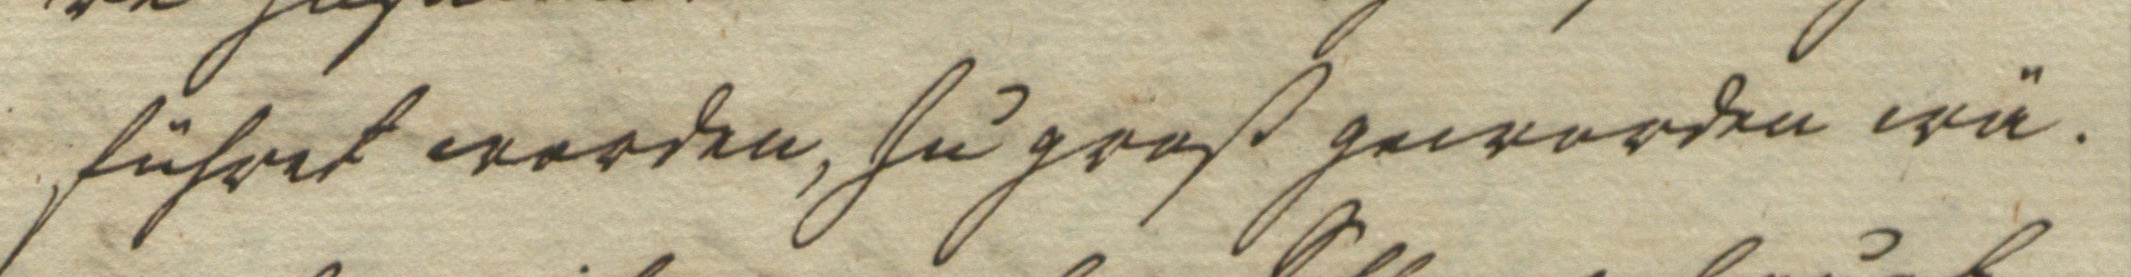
führet worden, zu groß geworden wä¬
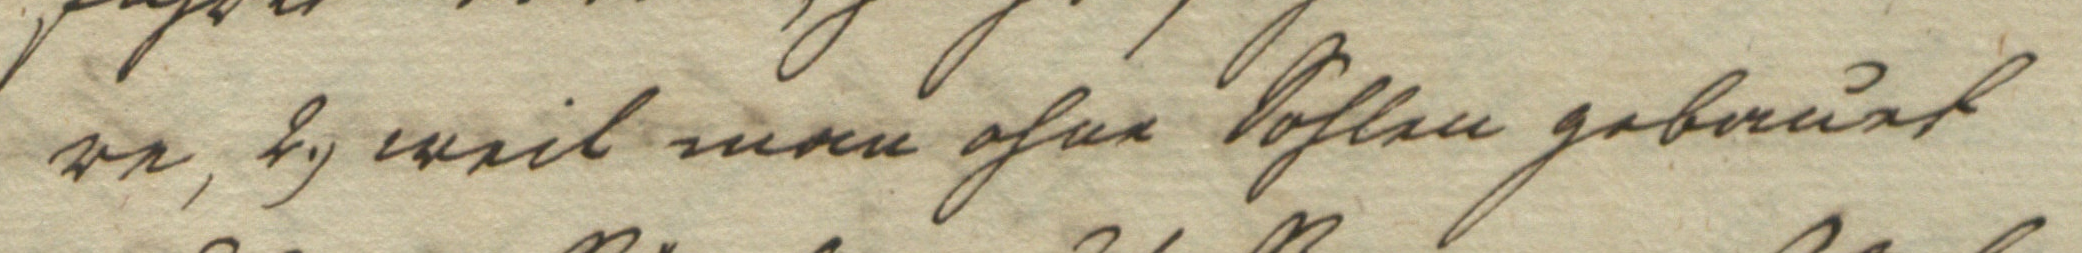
re, 2., weil man ohne Sohlen gobauet
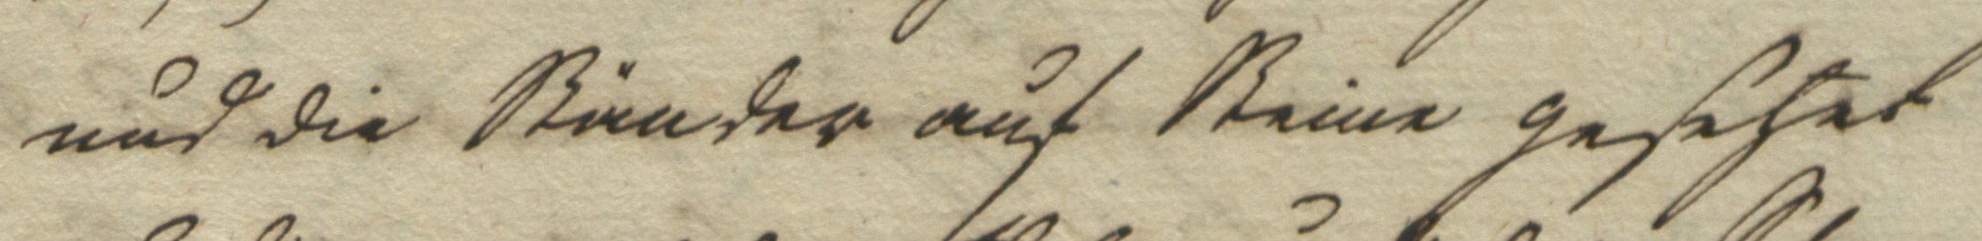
und die Ständer auf Steine gesetzet
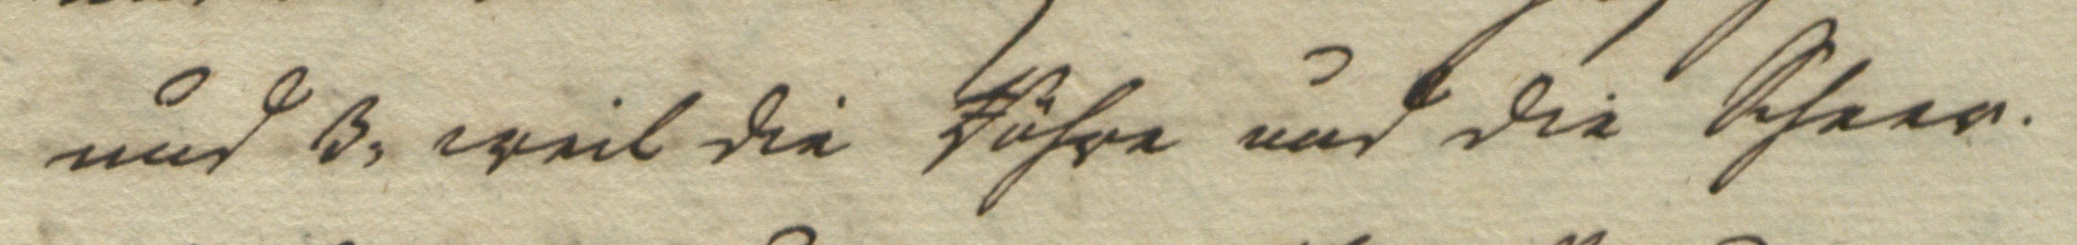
und 3., weil die Röhre und die Scheer¬
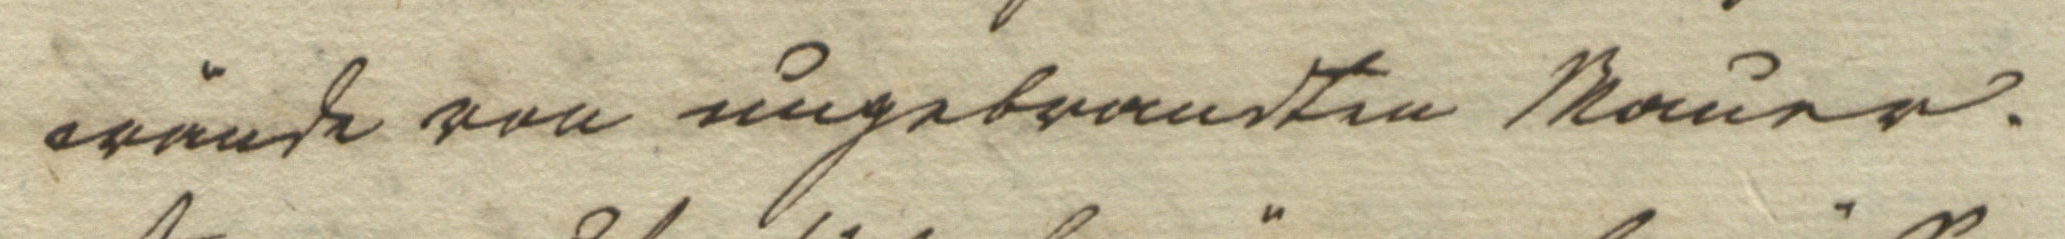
wände von ungebrandten Mauer¬
